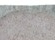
unsre
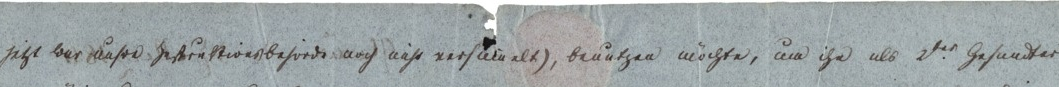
Instruktionsbehörde noch nicht versammelt), benutzen möchte, um ihn
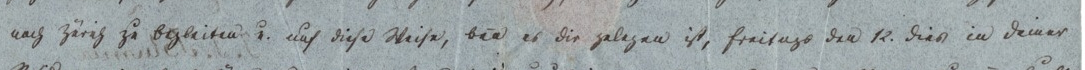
nach Zürich zu begleiten u. auf diese Weise, wenn es Dir gelegen ist, Freitags den 12. dies in Deiner
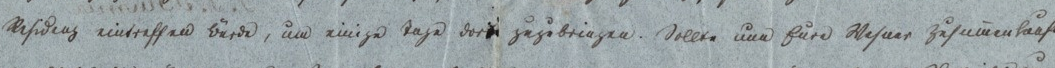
Residenz eintreffen würde, um einige Tage dort zuzubringen. Sollte nun Eure Wesner Zusammenkunft
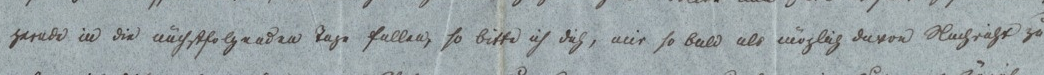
gerade in die nächstfolgenden Tage fallen, so bitte ich Dich, mir so bald als möglich davon Nachricht zu
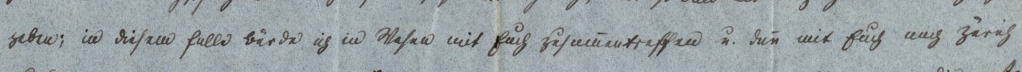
geben; in diesem Falle würde ich in Wesen mit Euch zusammentreffen u. dann mit Euch nach Zürich
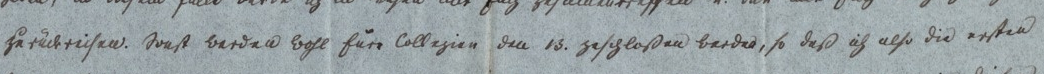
zurückreisen. Sonst werden wohl Eure Collegien den 13. geschlossen werden, so daß ich also die ersten
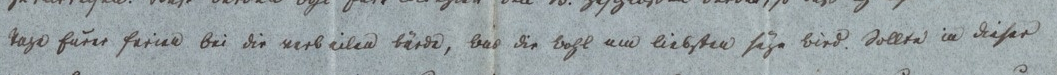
Tage Eurer Ferien bei Dir verweilen würde, was Dir wohl am liebsten seyn wird. Sollte in dieser
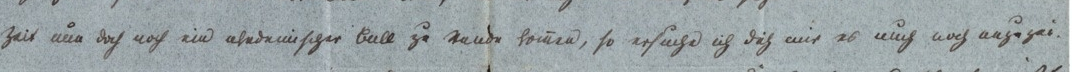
Zeit nun doch noch ein akademischer Ball zu Stande kommen, so ersuche ich Dich mir es auch noch anzuzei-
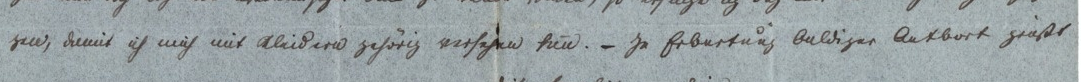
gen, damit ich mich mit Kleidern gehörig versehen kann. – In Erwartung baldiger Antwort grüßt
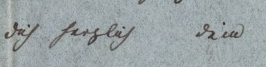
Dich herzlich Dein
